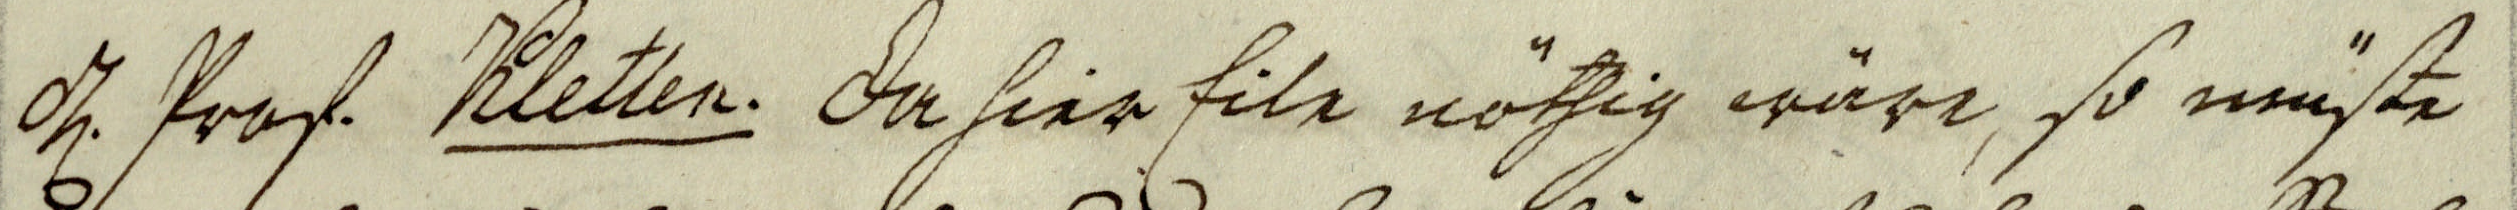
dh. Prof. Kletten. Da hier Eile nöthig wäre, so müsste
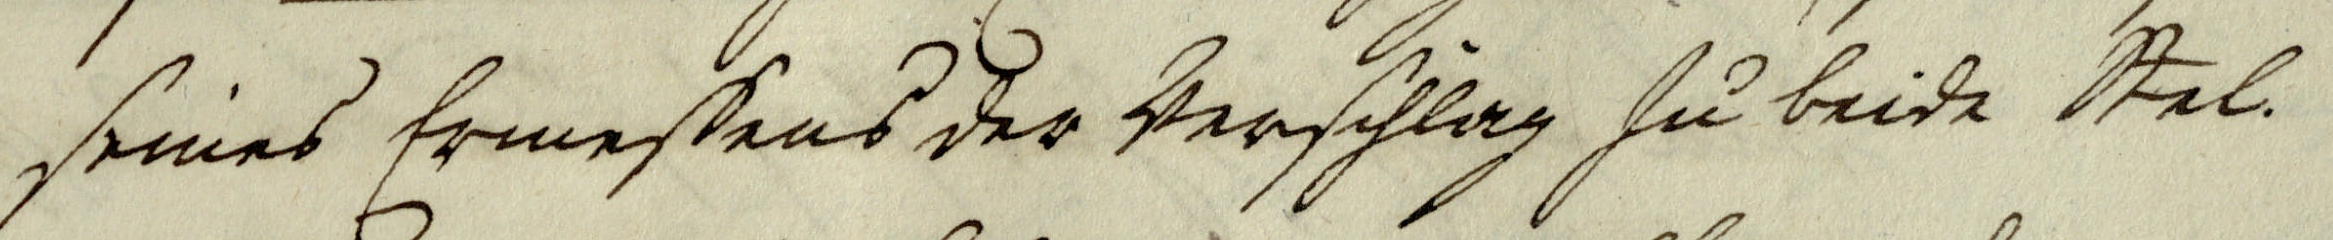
seines Erachtens der Vorschlag zu beide Stel¬
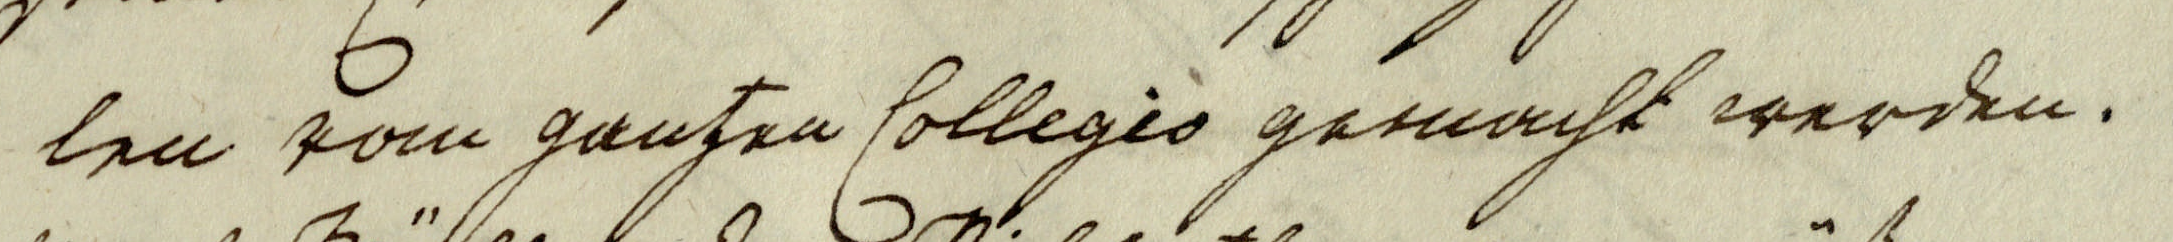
len vom gantzen Collegio gemacht werden.
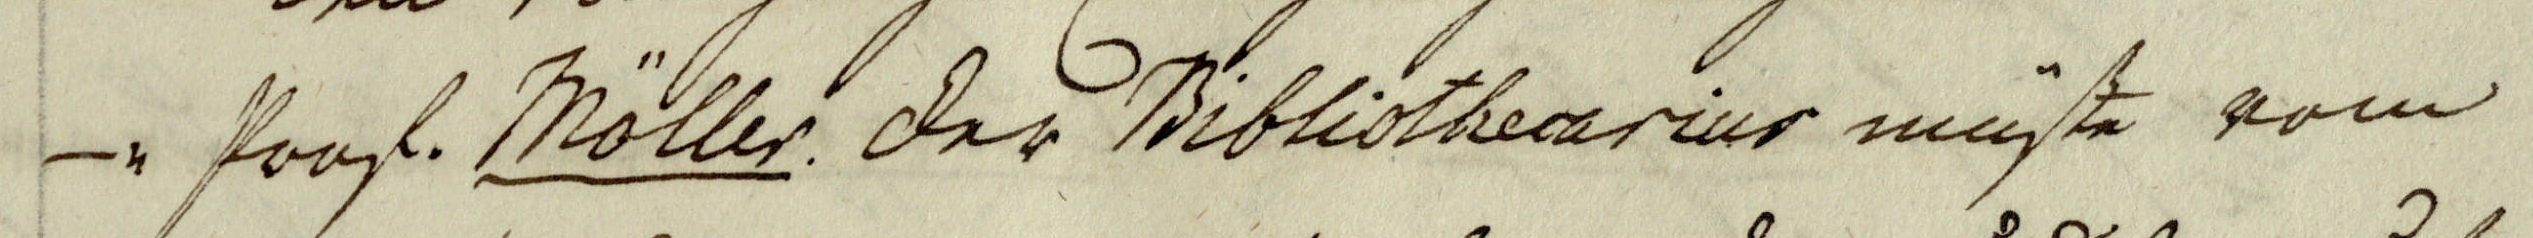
— " Prof. Möller. Der Bibliothecarius müsste vom
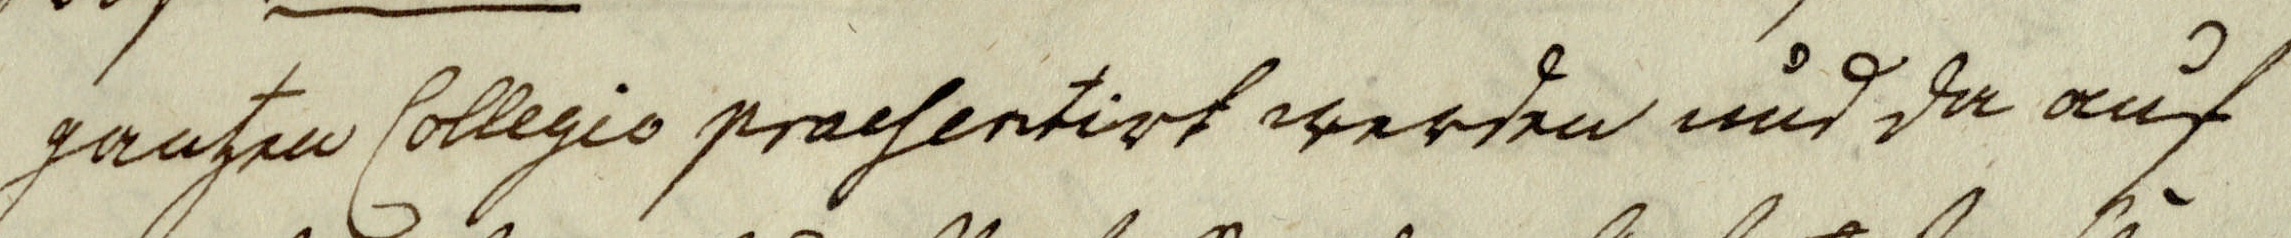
gantzen Collegio praesentirt werden und da auf
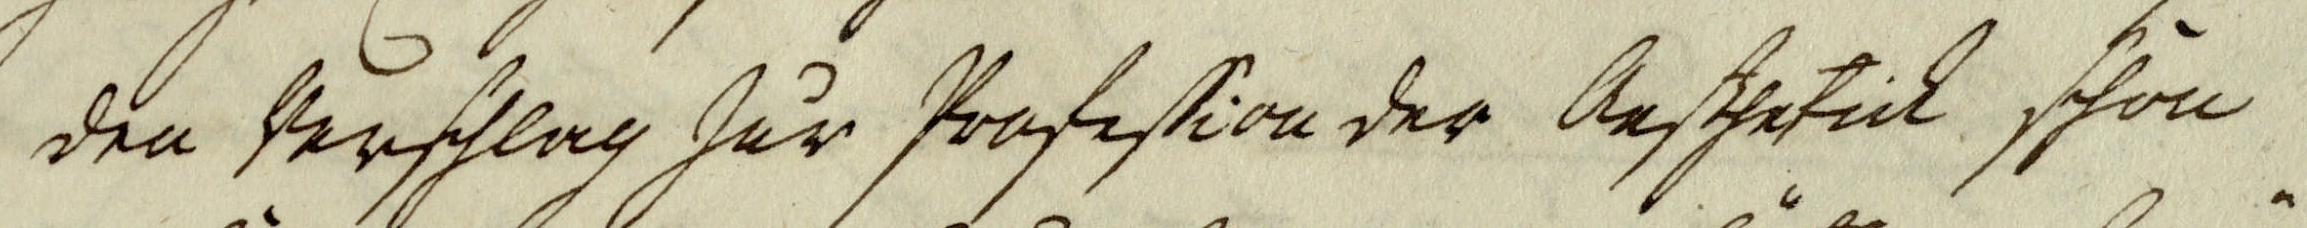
den Vorschlag zur Profession der Aesthetik schon
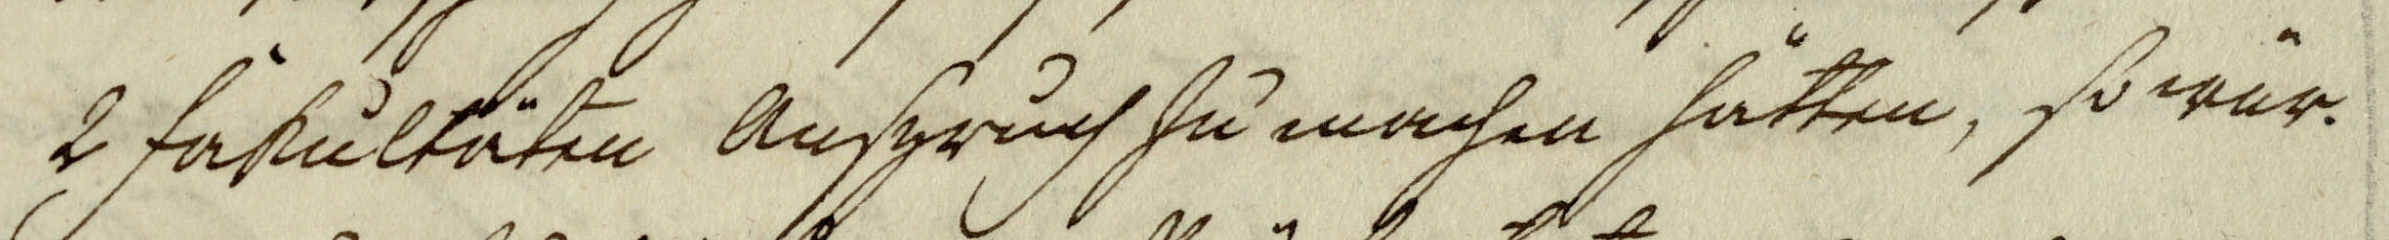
2 Fakultäten Anspruch zu machen hätten, so wür¬
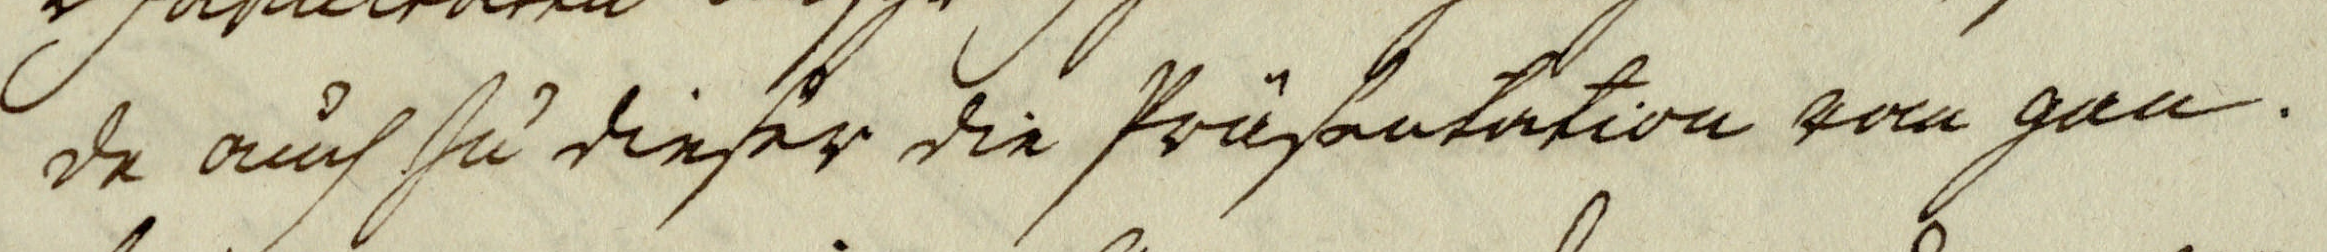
de auch zu dieser die Präsentation vom gan¬
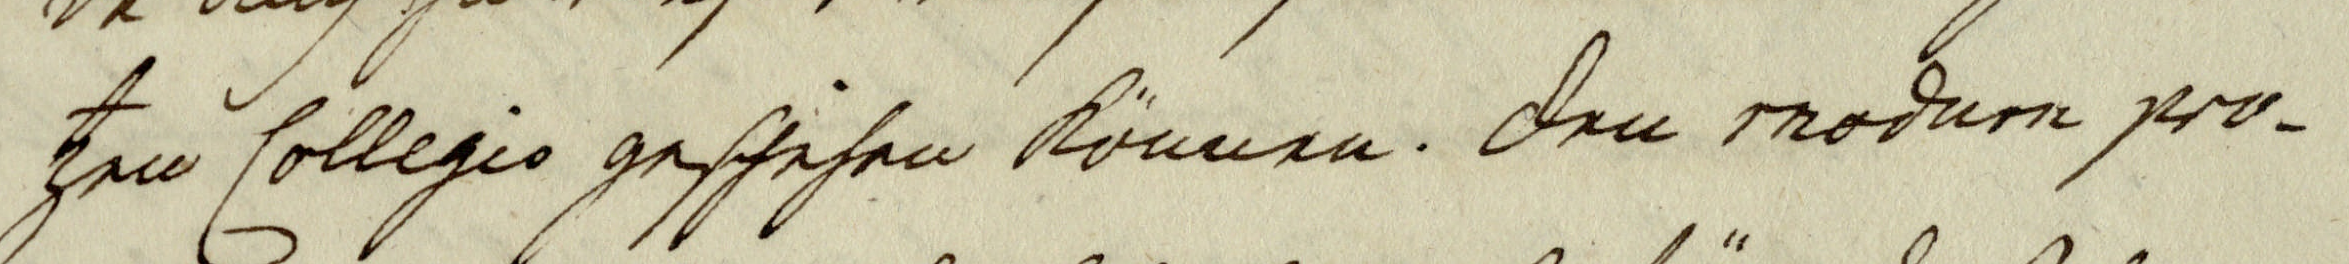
tzen Collegio geschehen können. Den modum pro¬
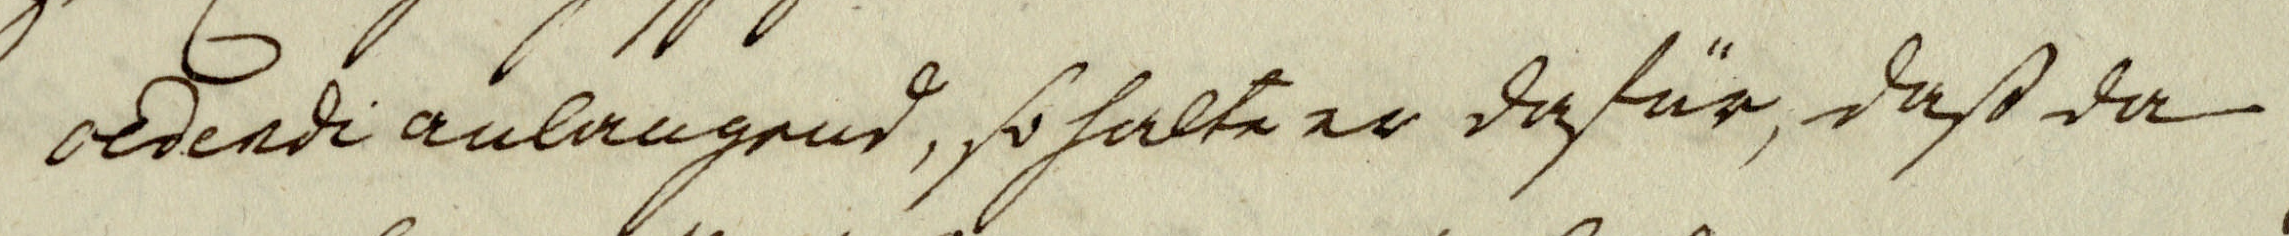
cedendi anlangend, so halte er dafür, daß da
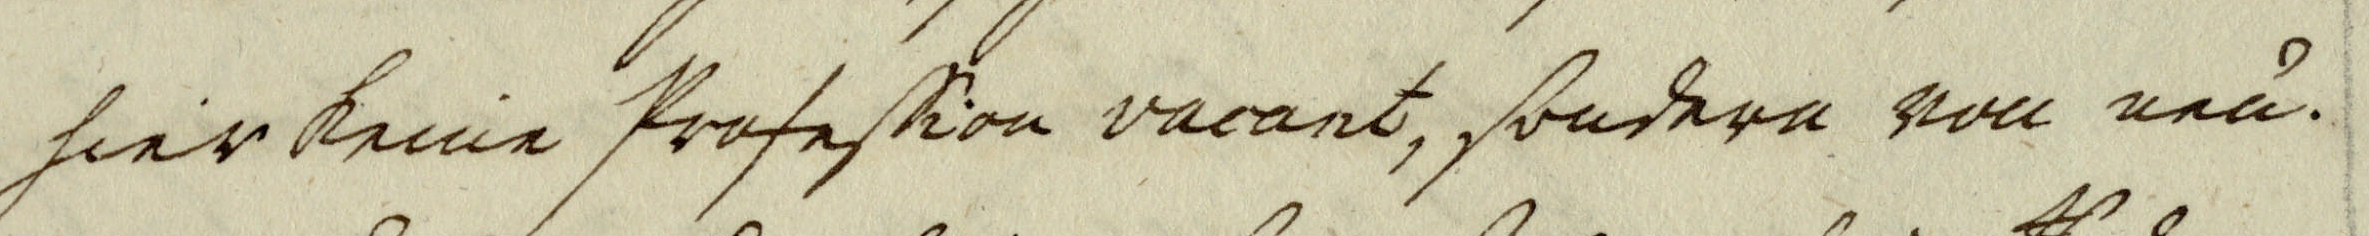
hier keine Profession vacant, sondern von neu¬
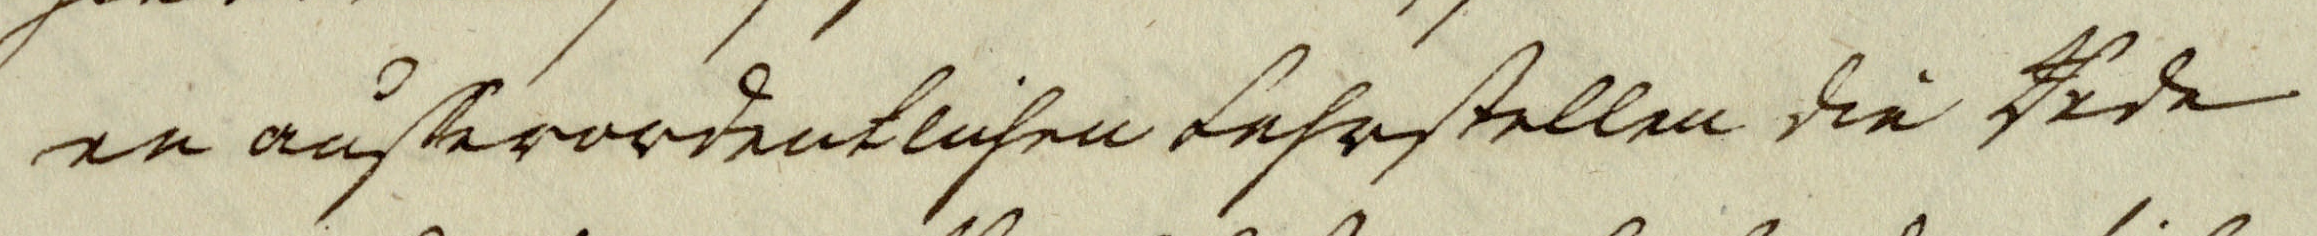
en ausserordentlichen Lehrstellen die Rede
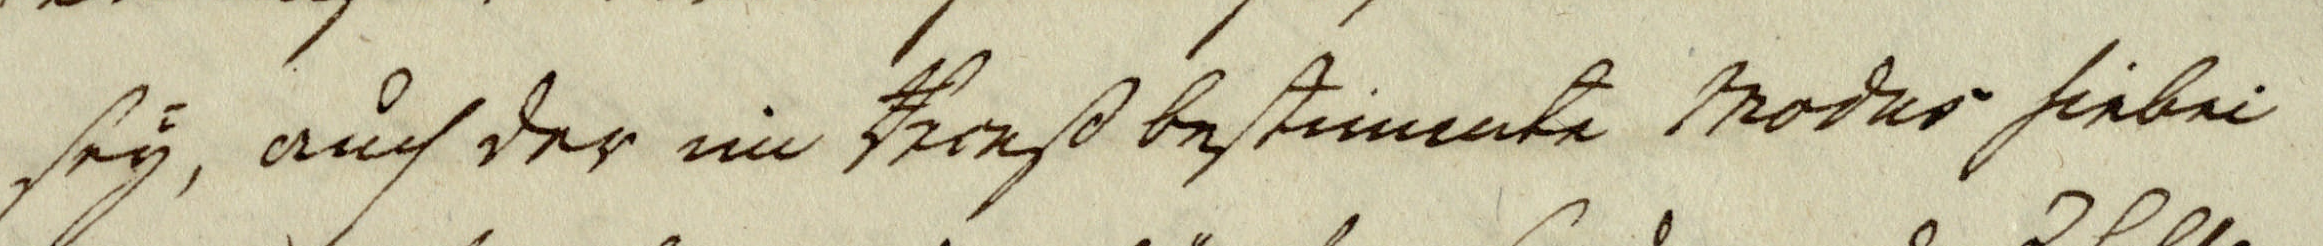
seÿ, auch der im Receß bestimmte Modus hiebei
